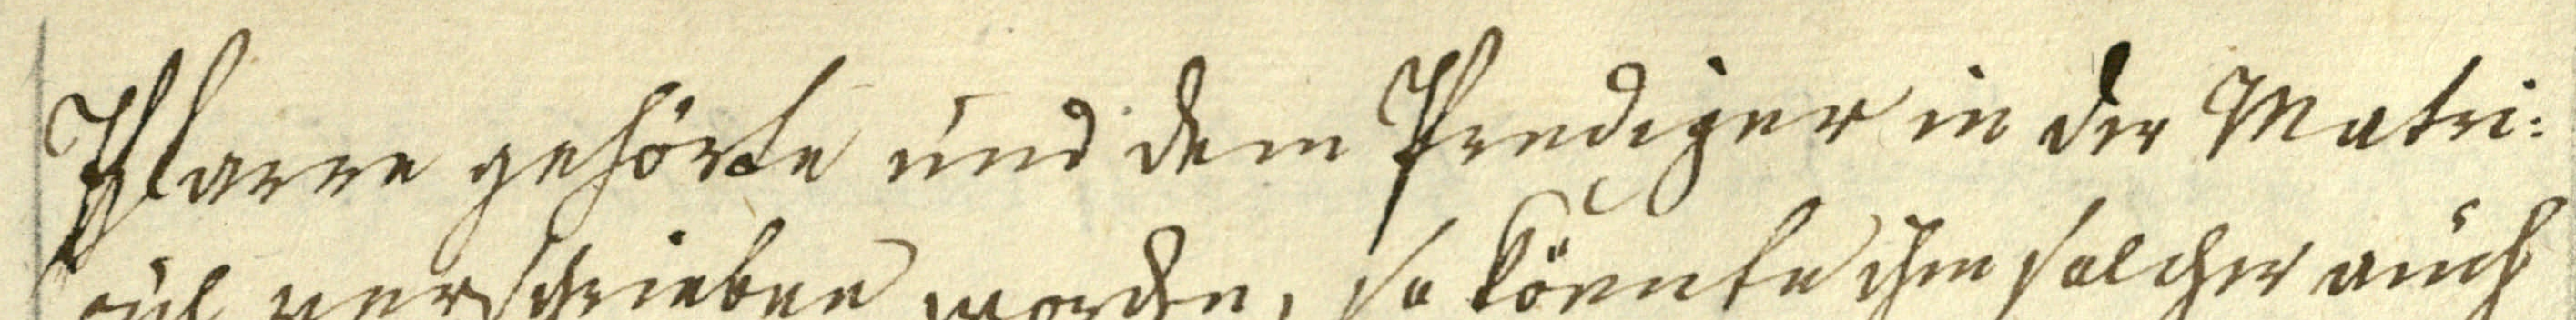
Pfarre gehörte und dem Prediger in der Matri¬
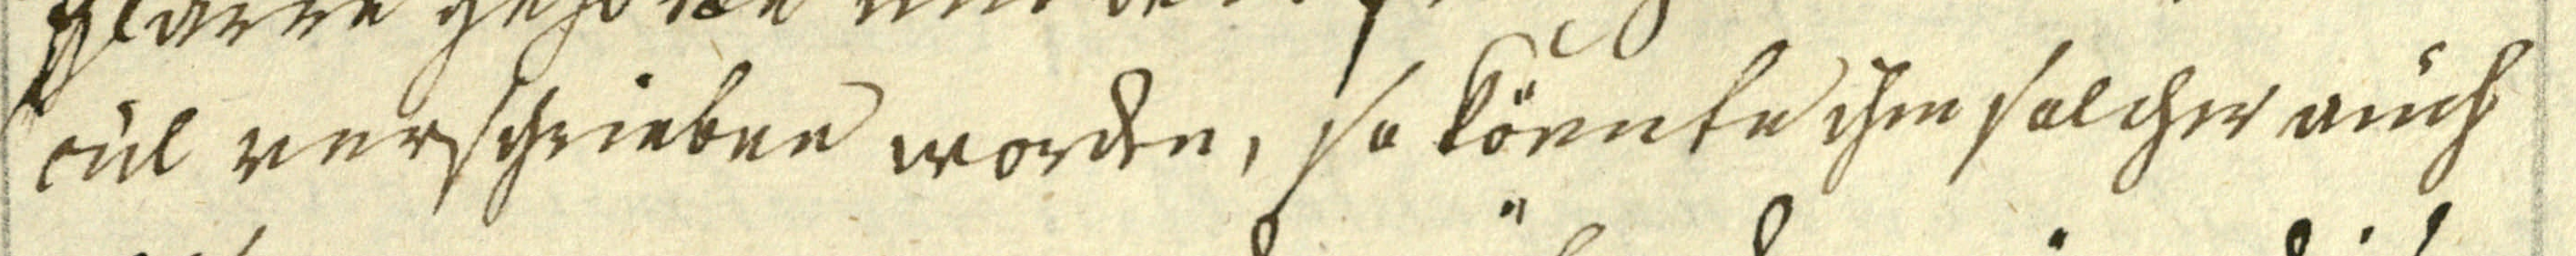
cul verschrieben worden, so könnte ihm solcher auch
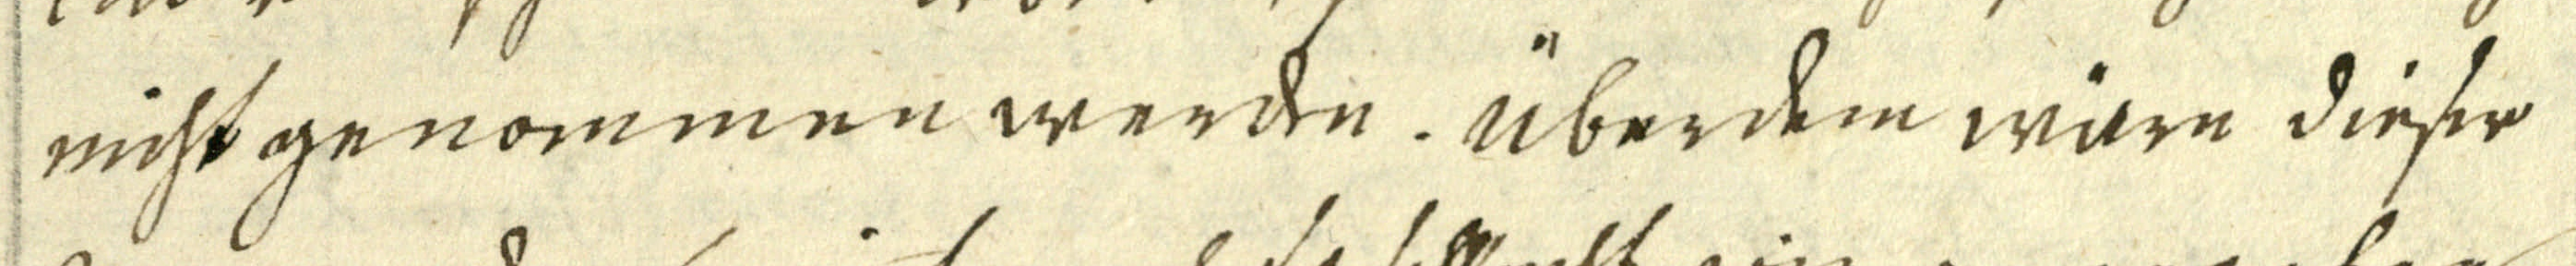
nicht genommen werden. Überdem wäre dieser
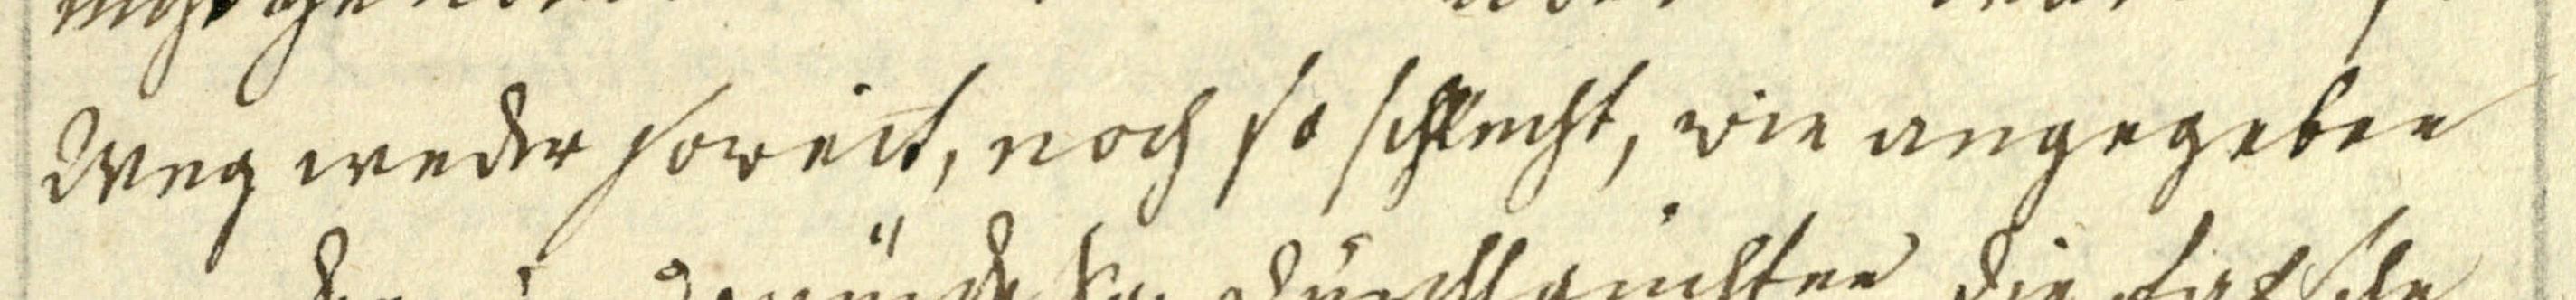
Weg weder soweit, noch so schlecht, wie angegeben
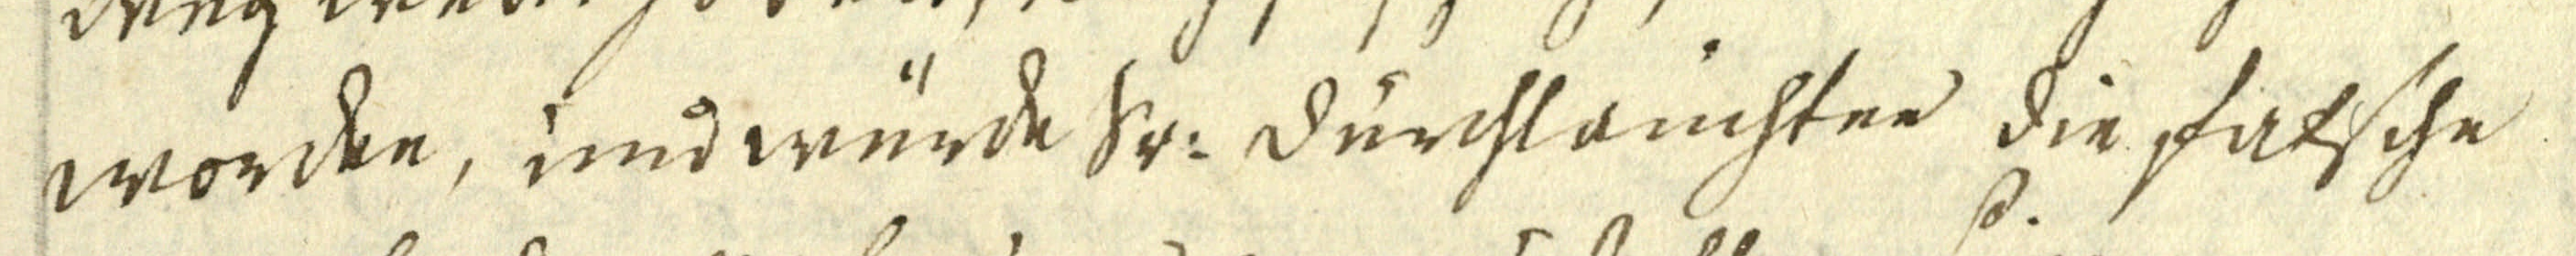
worden, und würde Sr Durchlauchten die falsche
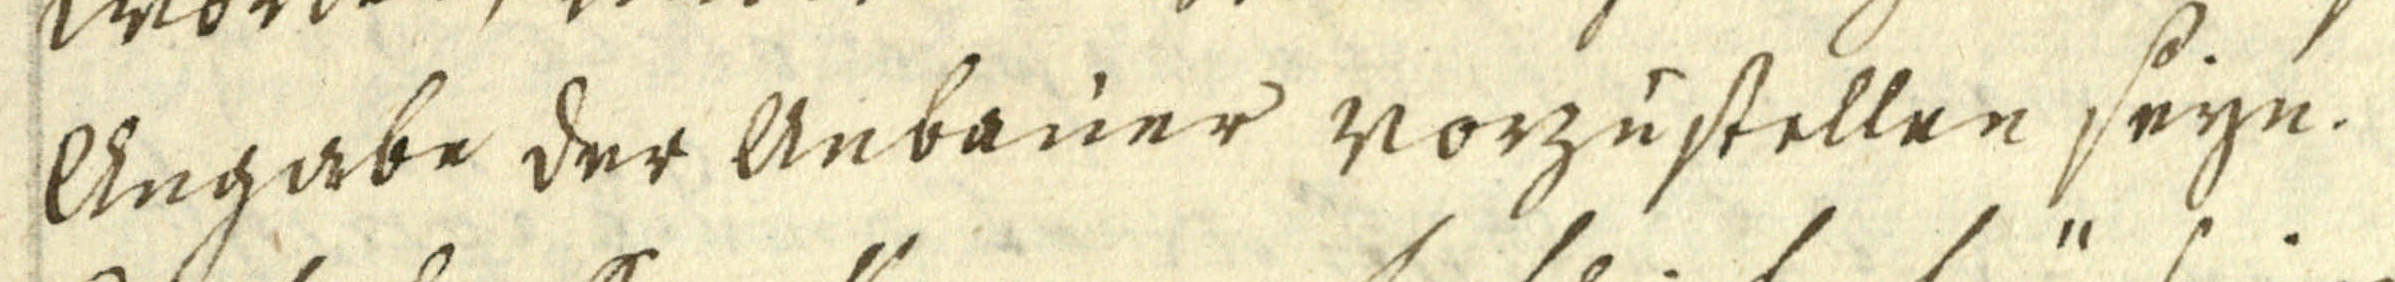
Angabe der Anbauer vorzustellen seÿn.
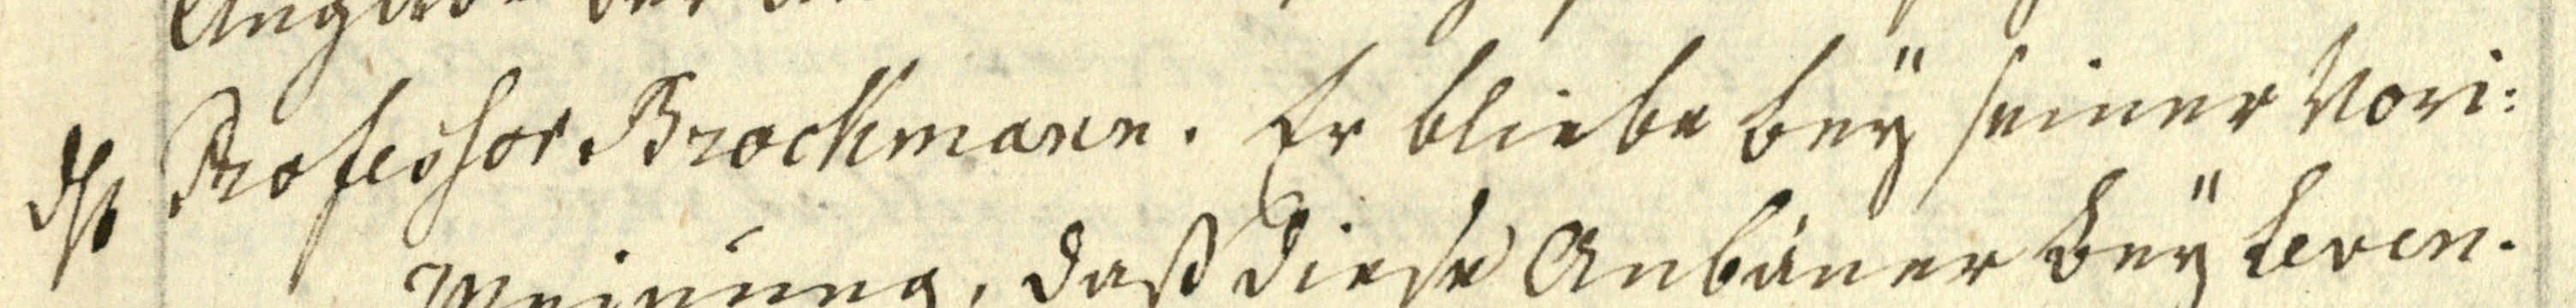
dh Professor Brockmann. Er bliebe beÿ seiner vori¬
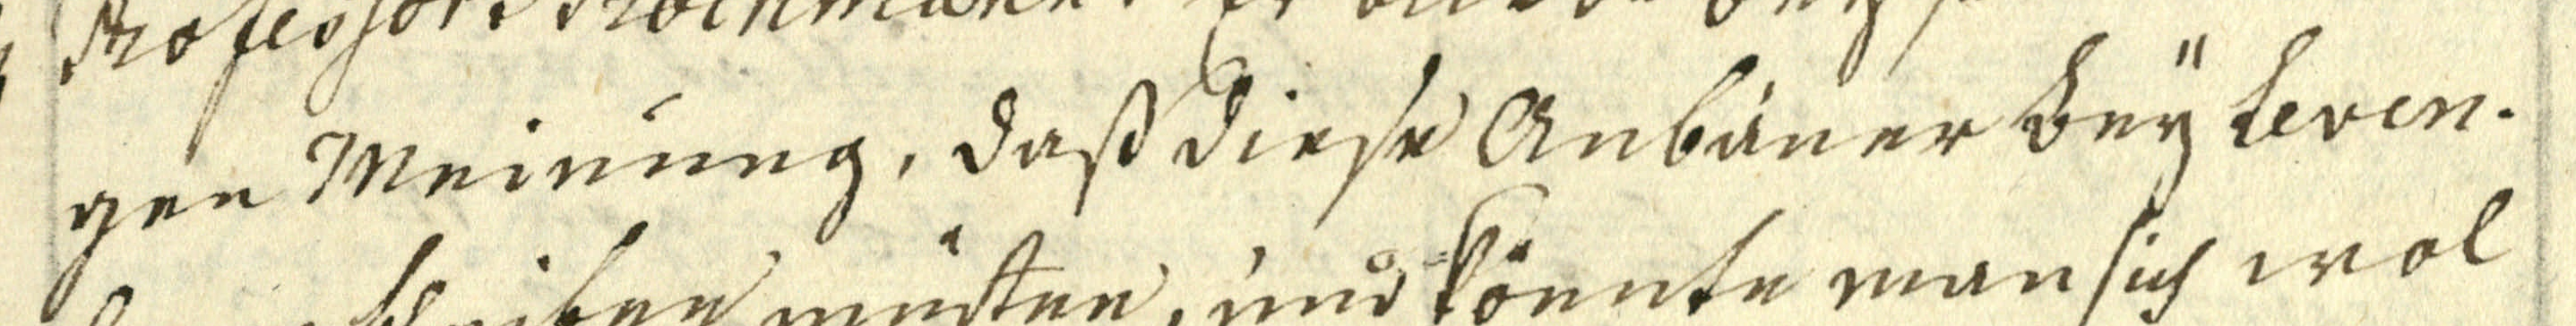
gen Meinung, daß diese Anbauer beÿ Leven¬
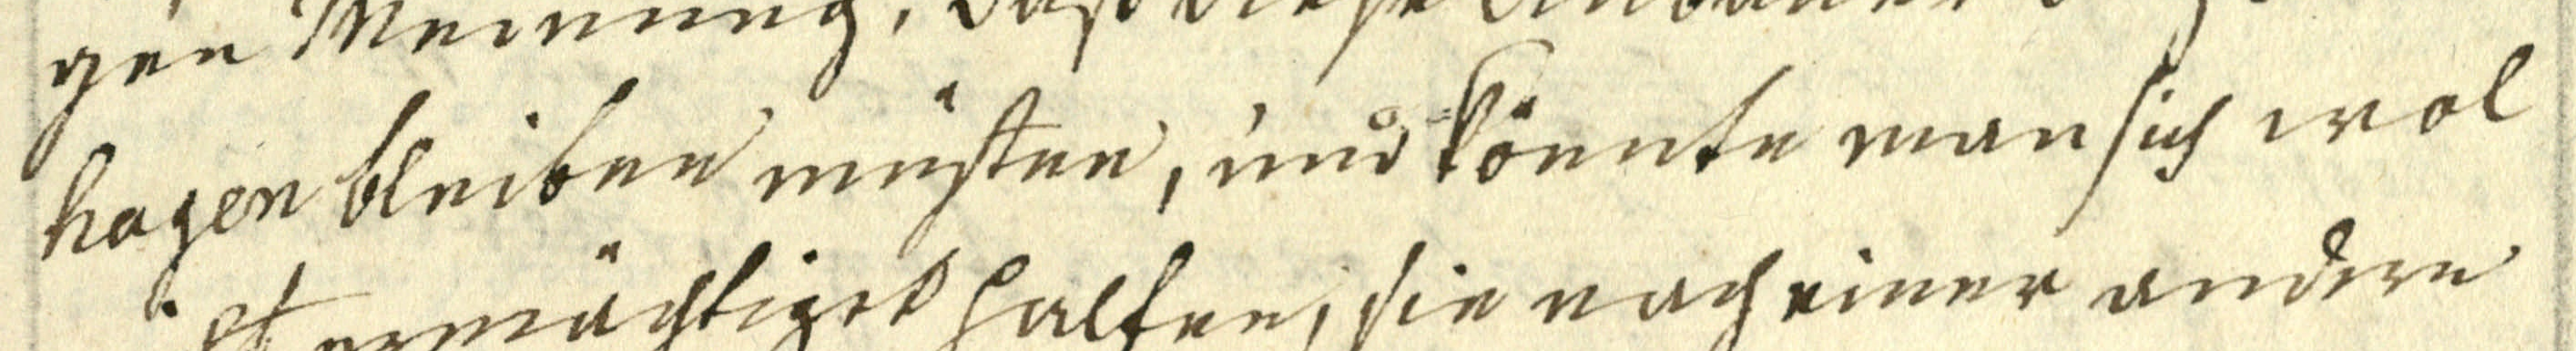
hagen bleiben müsten, und könnte man sich wol
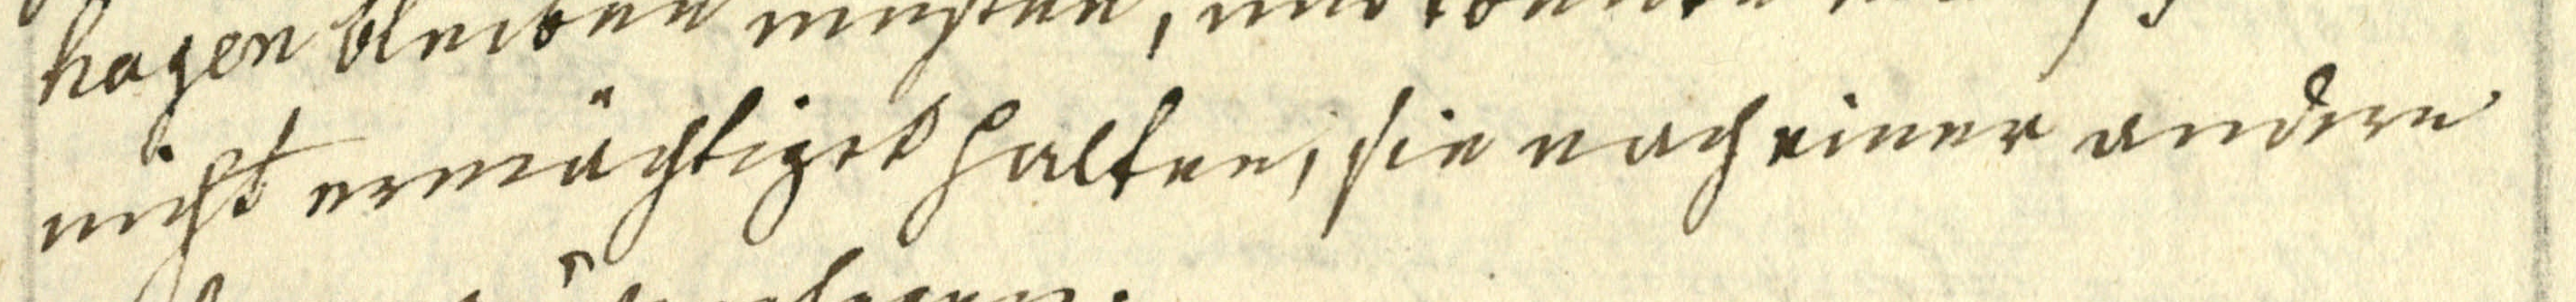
nicht ermächtiget halten, die nach einer andern
